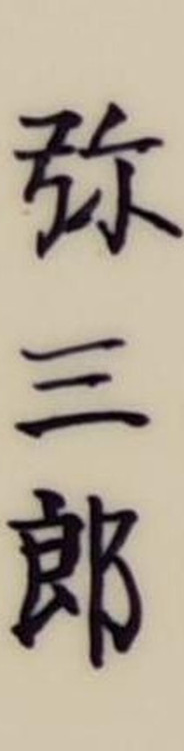弥三郎
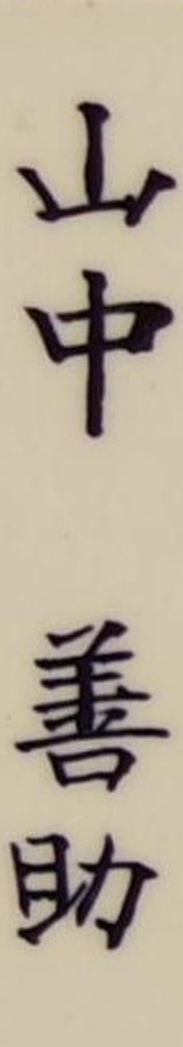山中善助
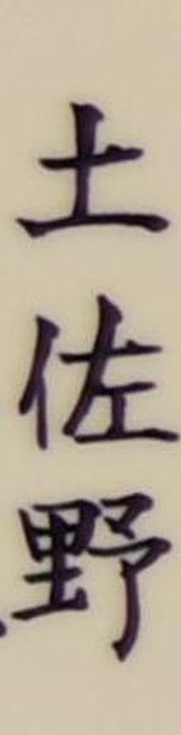土佐野

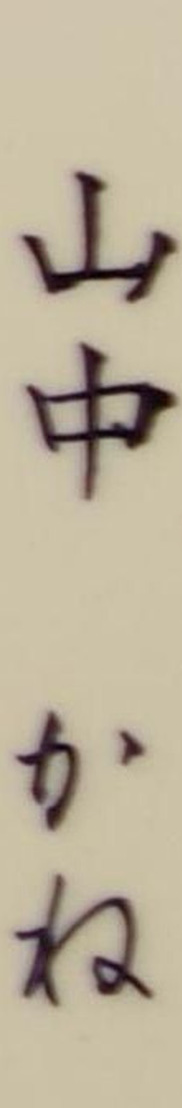山中かね
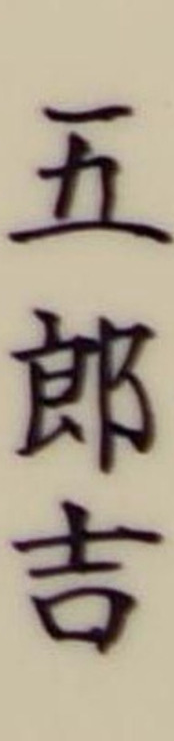五郎吉
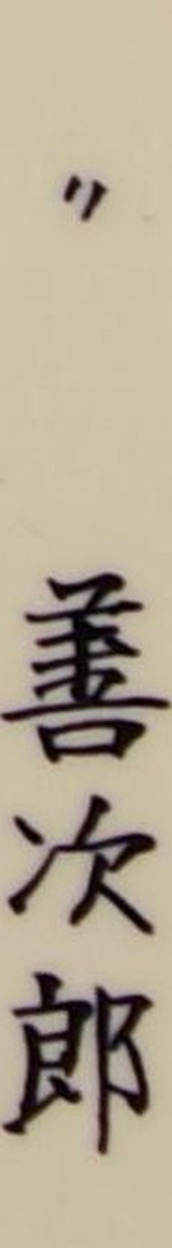善次郎
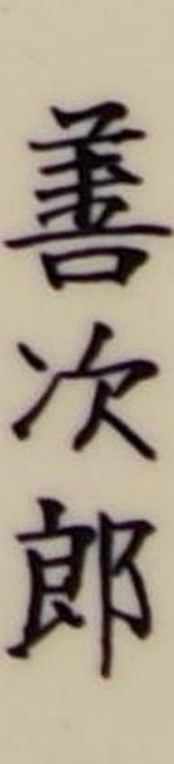善次郎
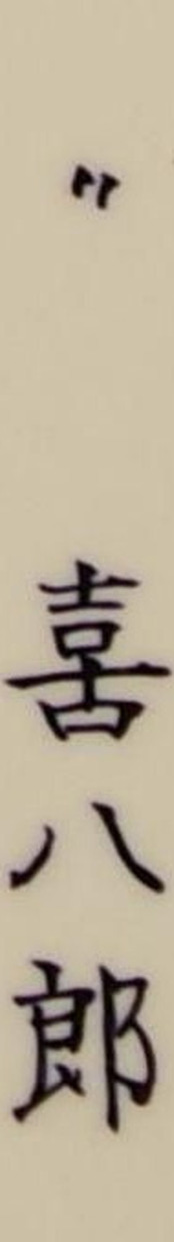喜八郎
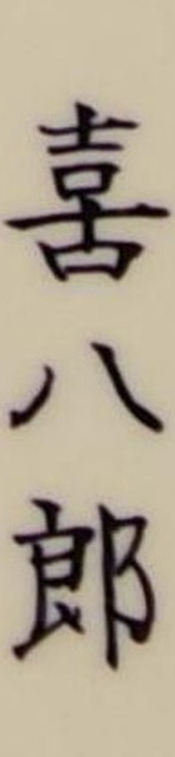喜八郎
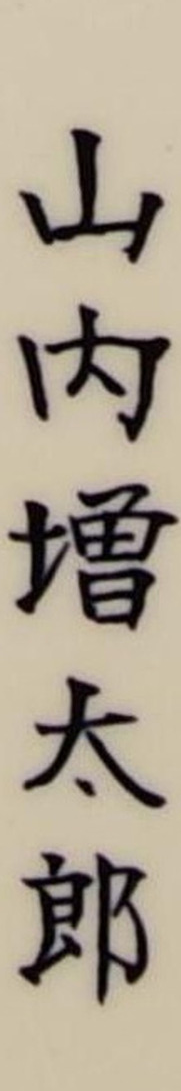山内増太郎
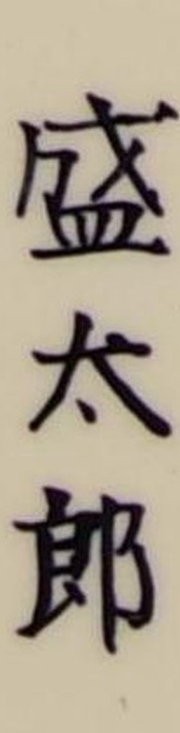盛太郎
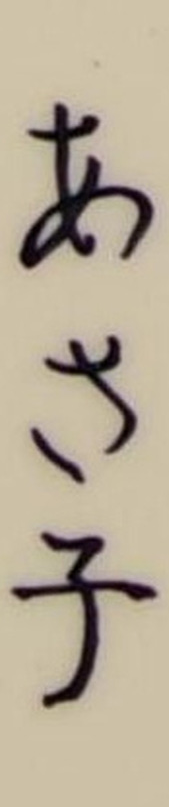あさ子
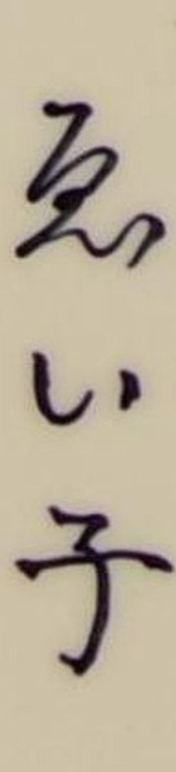ゑい子
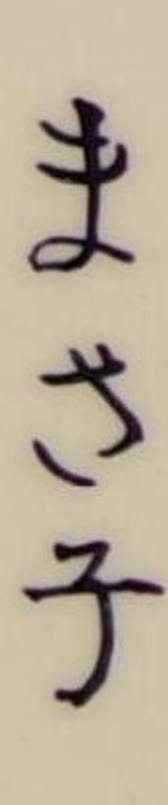まさ子
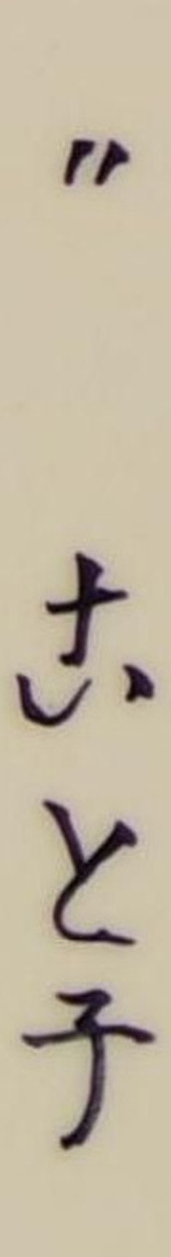こと子
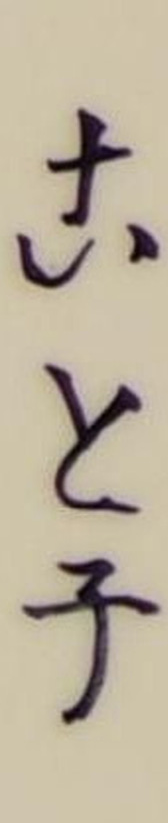こと子
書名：A~D
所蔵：koyasan kongobuji
